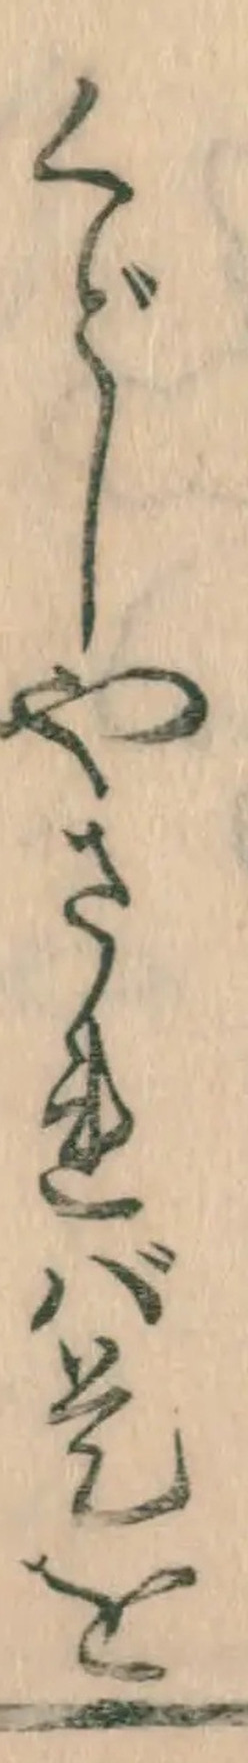くどしやされば是を
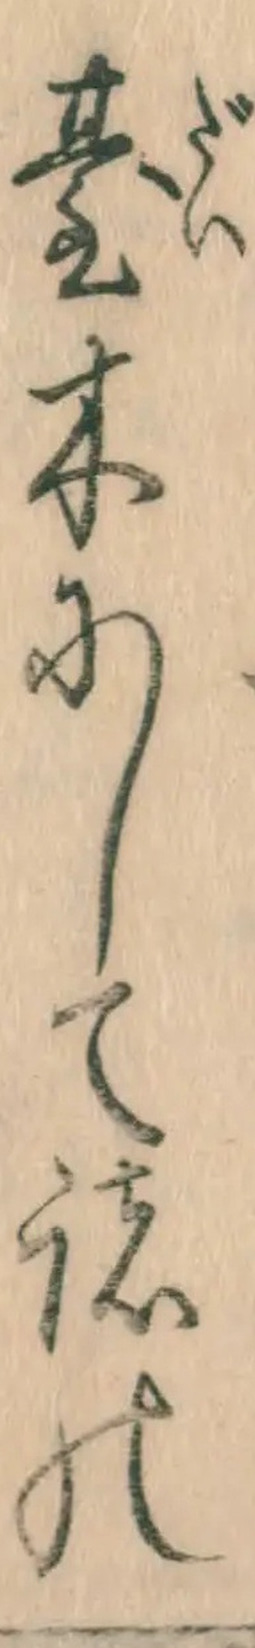臺木にして諸の
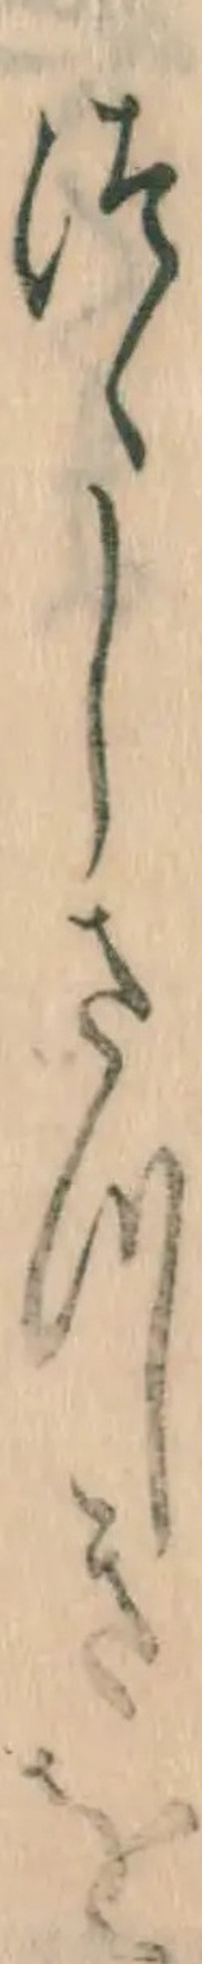つゝしさつきを
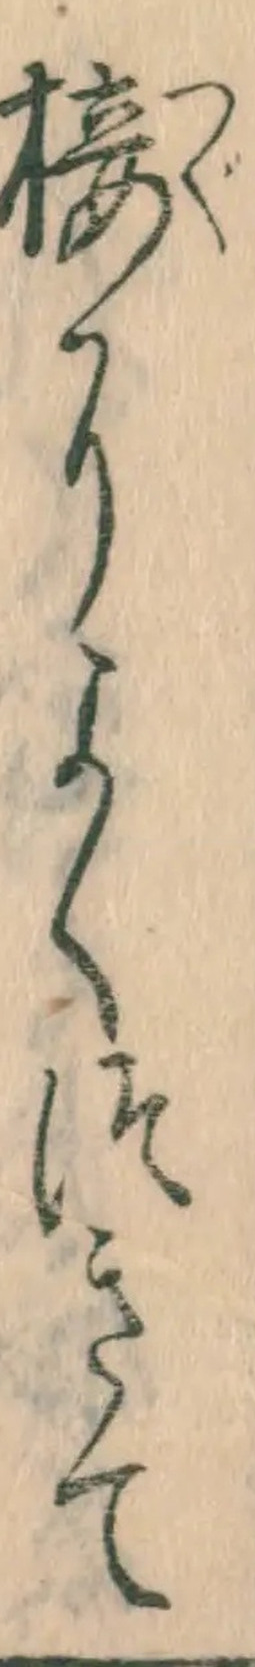接によくつきて
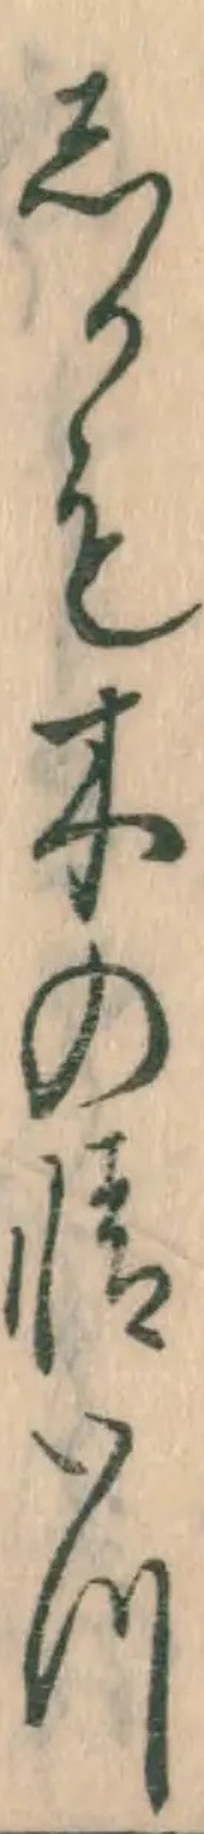しかも木の情いつ
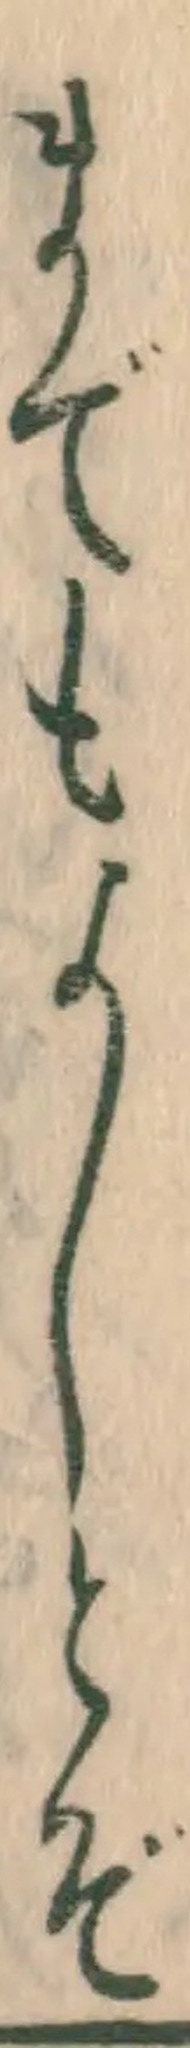までもよしとぞ
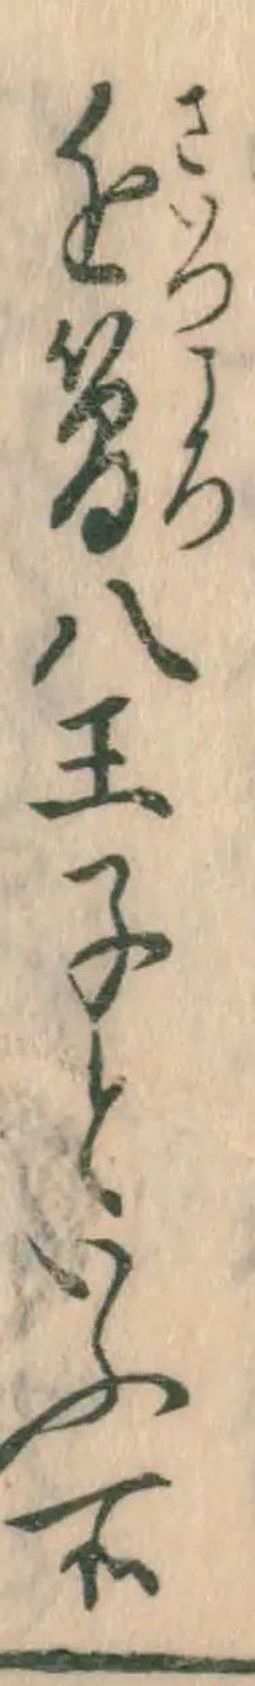近簡八王子といふ所
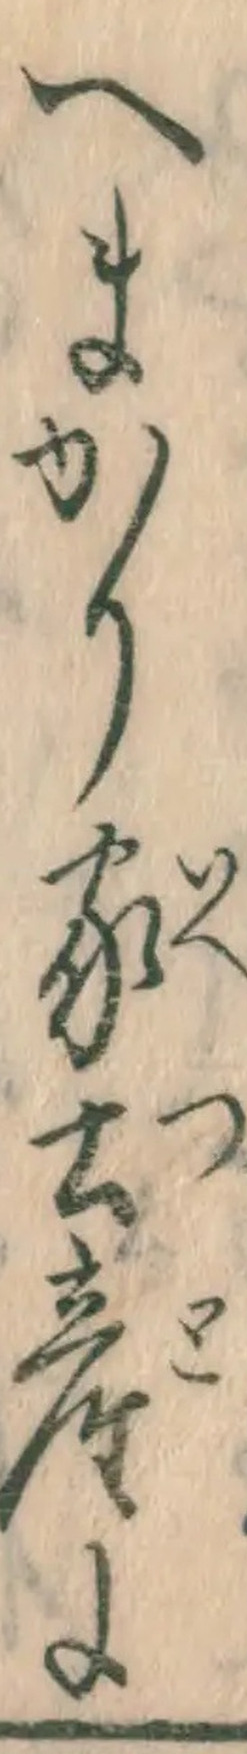へまかり家土産に
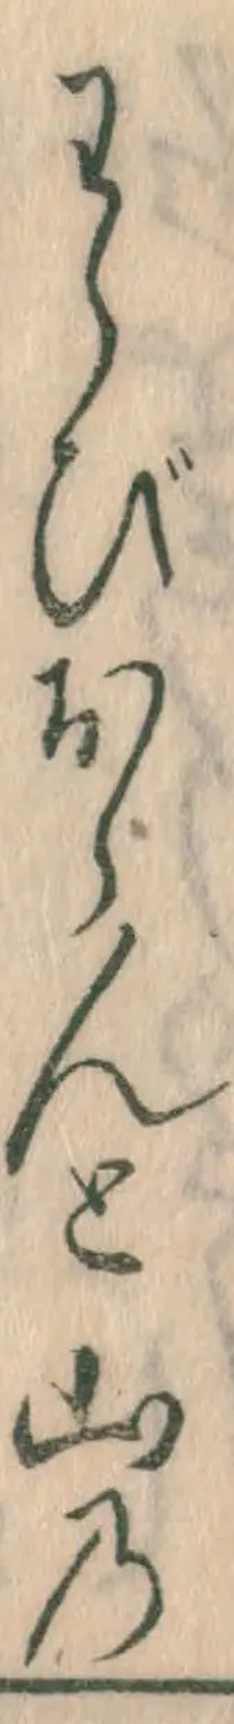わらびおらんと山の
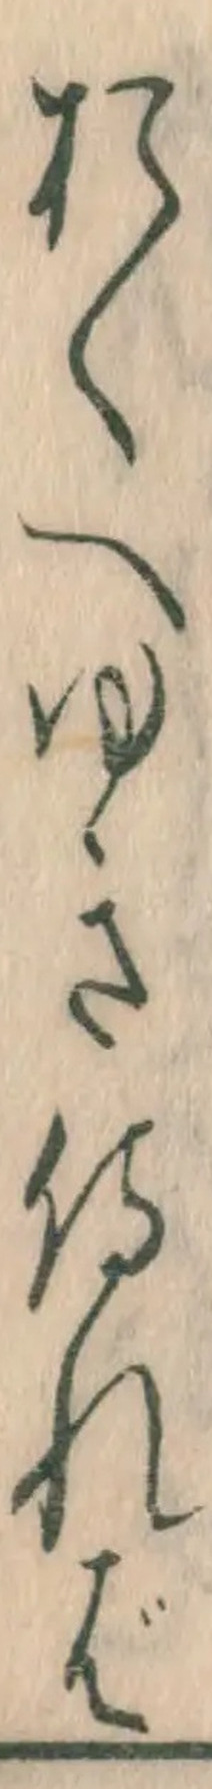おくへゆき侍れば
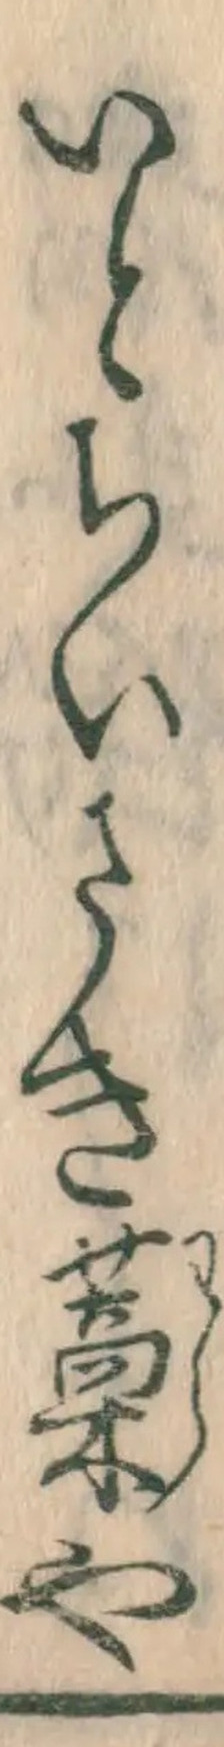いとちいさき藁や
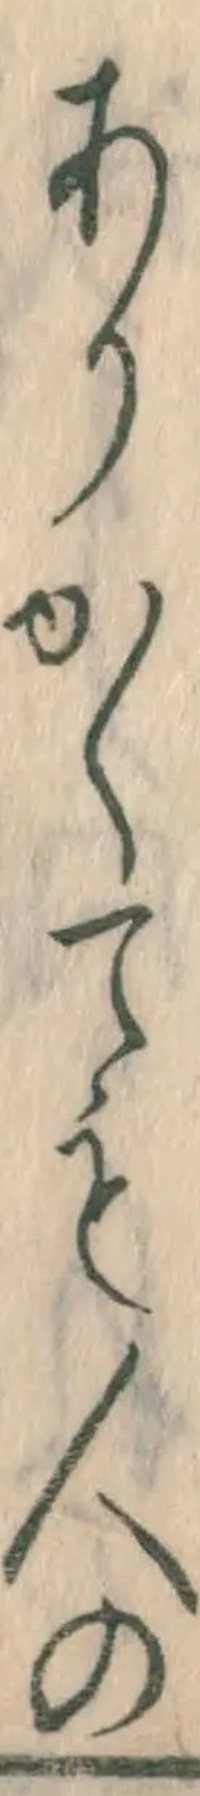ありかくても人の
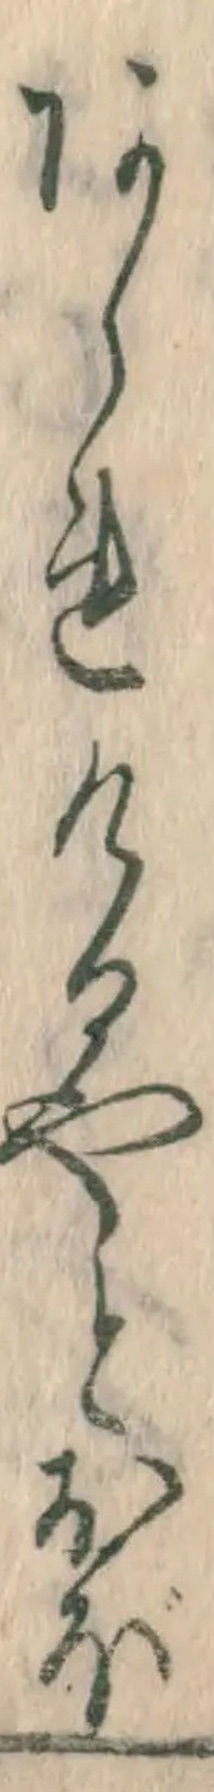あられけるやとおぼ
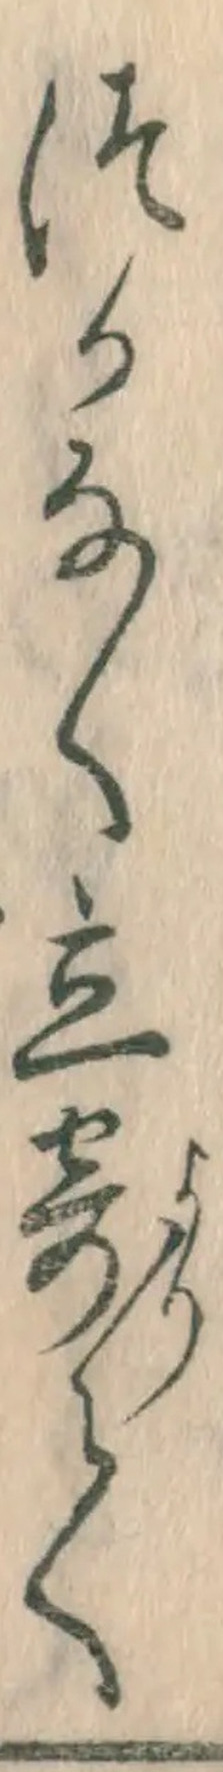つかなく立寄て
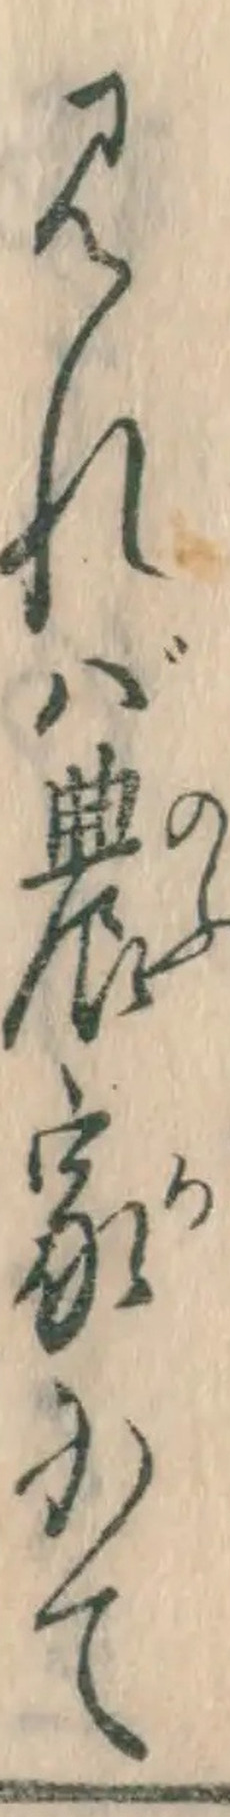見れば農家にて
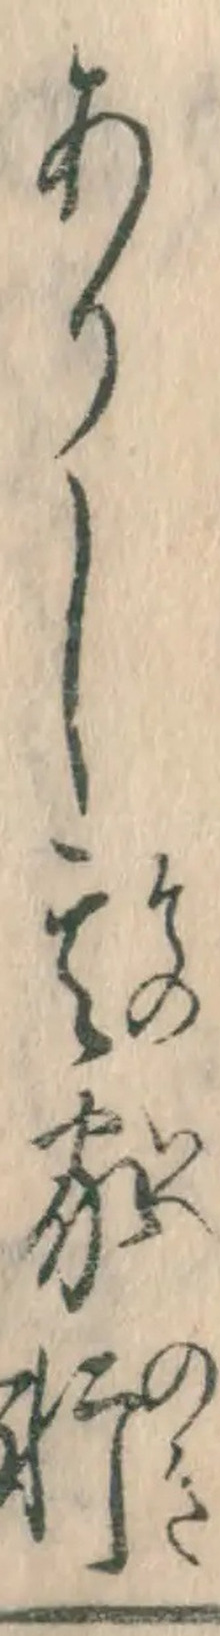ありし其家軒
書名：錦繍枕 5巻. [1]
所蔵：国立国会図書館 National Diet Library, JAPAN
